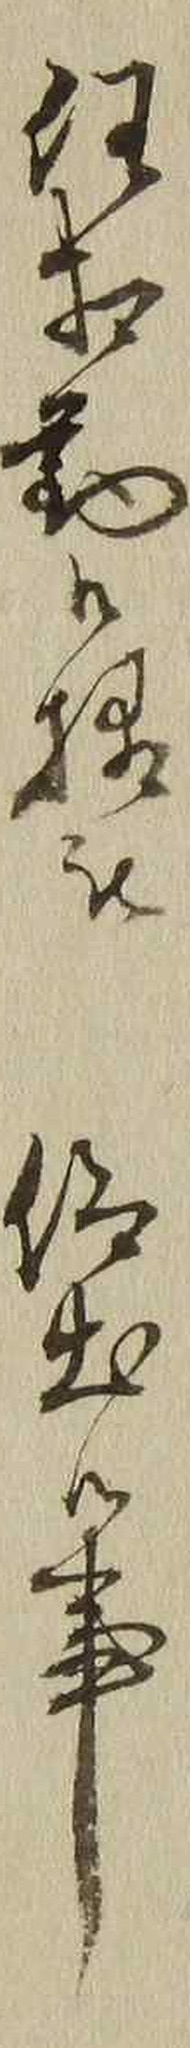任相勤候被仰出候事
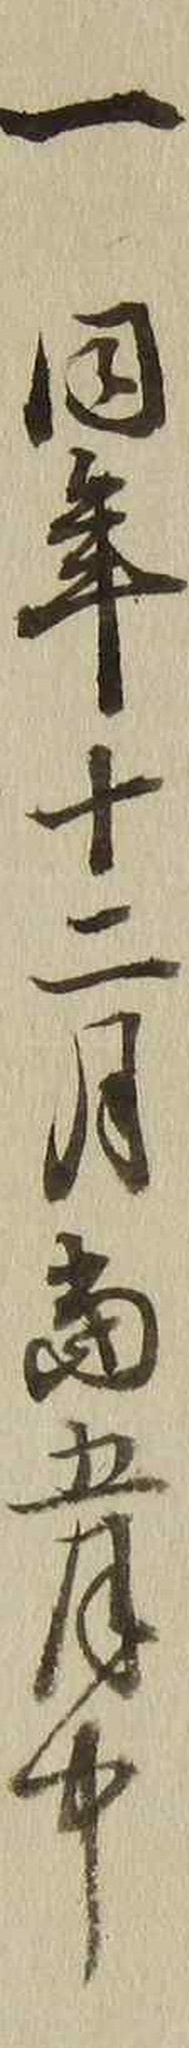一同年十二月当五月中
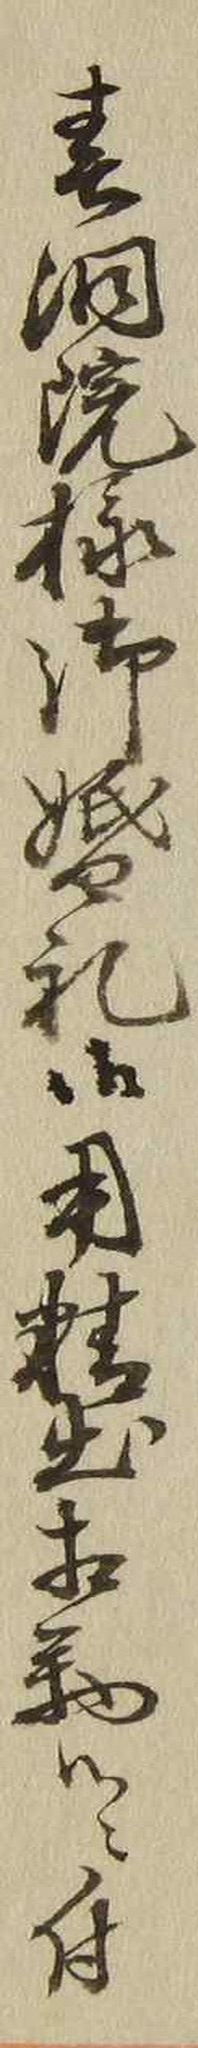春洞院様御婚礼御用精出相勤候ニ付
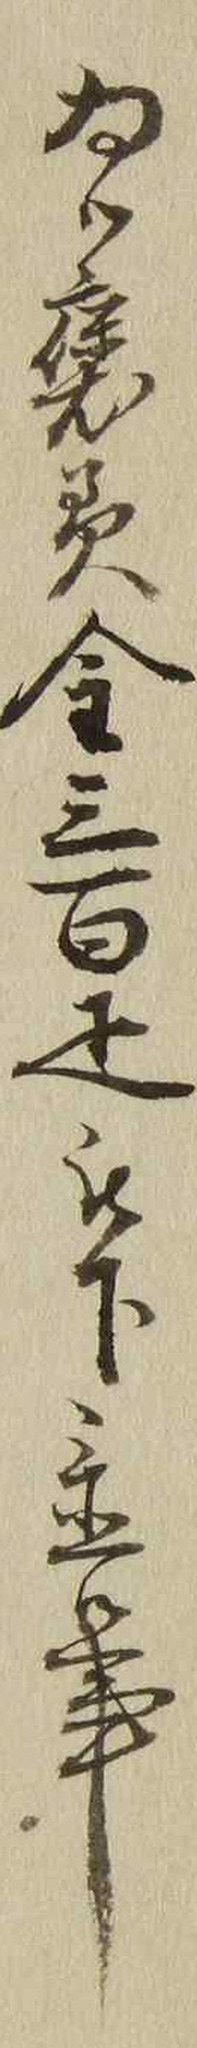為御褒美金三百疋被下置候事
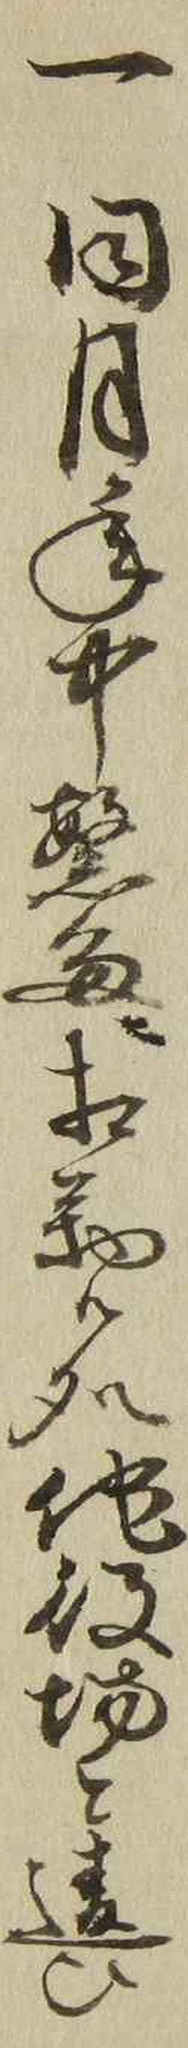一同月年中繫多ニ相勤候処他役場と違ひ

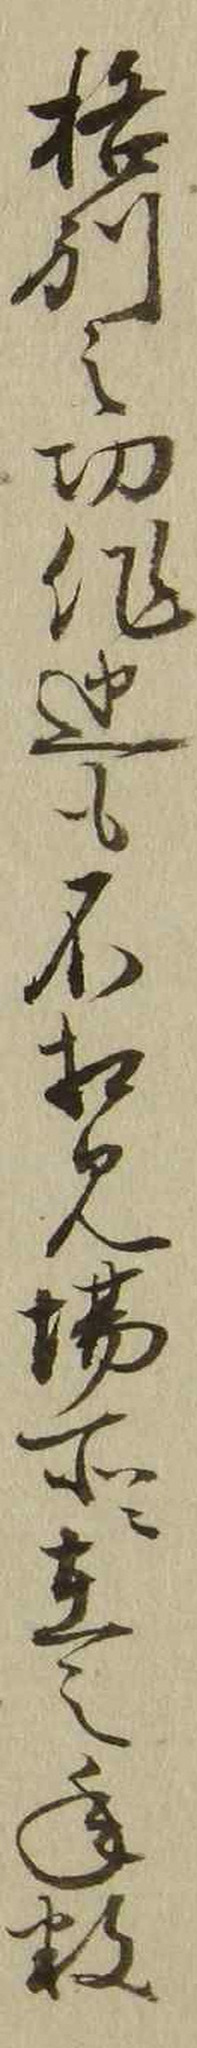格別之功作迚も不相見場所ニ在之年数
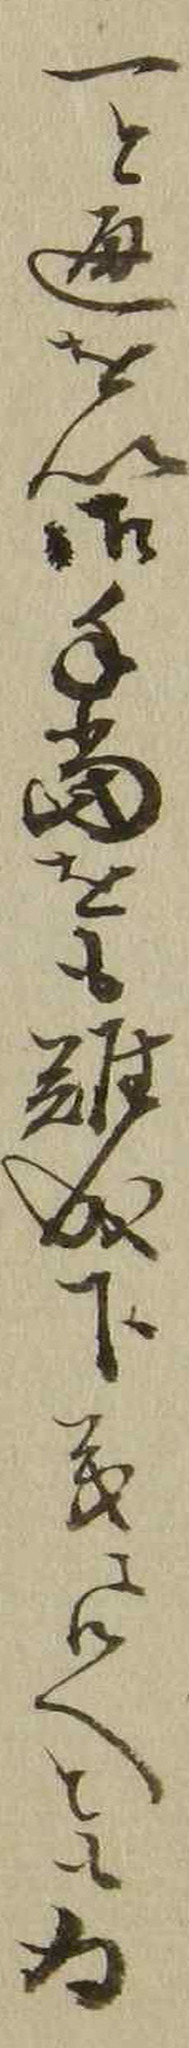一と通を以御手当をも難成下義ニ候へとも為
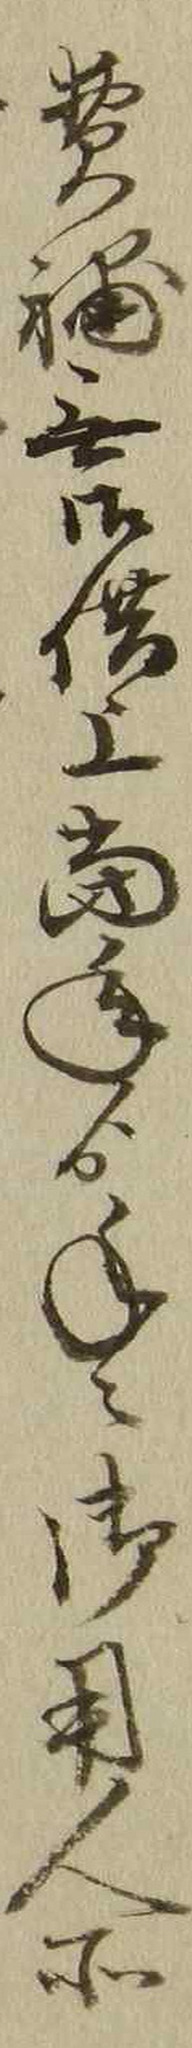費補無御借上当年ゟ年々御用人所
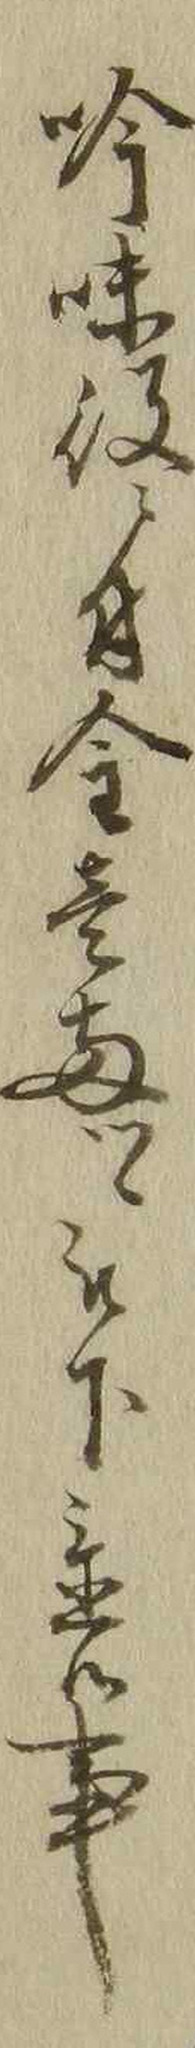吟味役ニ付金壱両ツヽ被下置候事
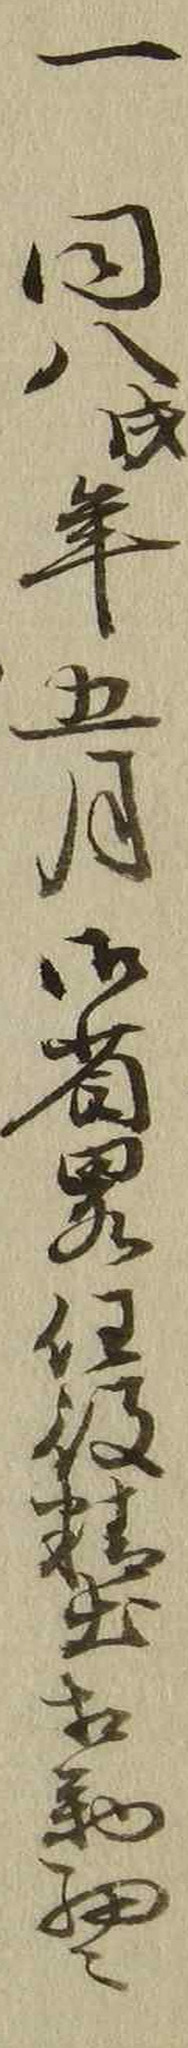一同八戌年五月御省略任役精出相勤細々
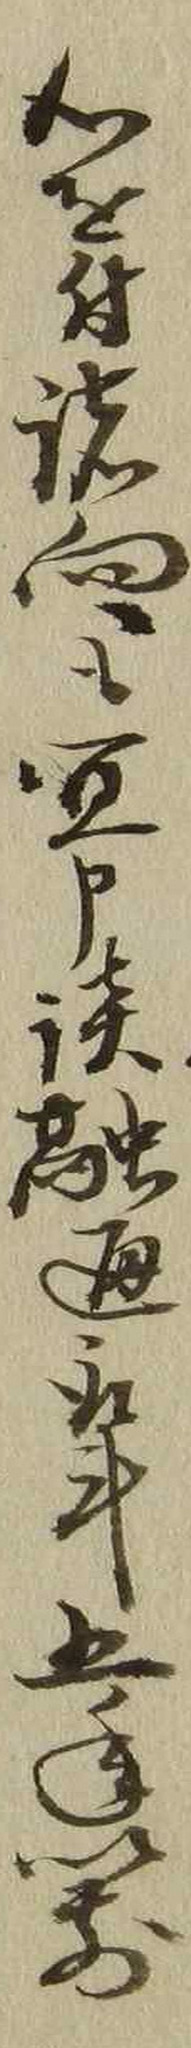心を付諸向へも宣申談融通取斗五年以前
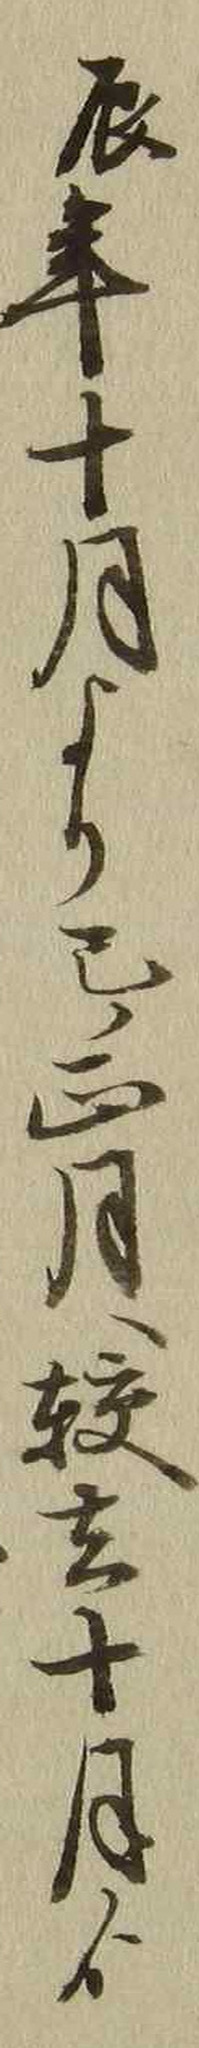辰年十月より巳ノ正月ヘ較去十月ゟ
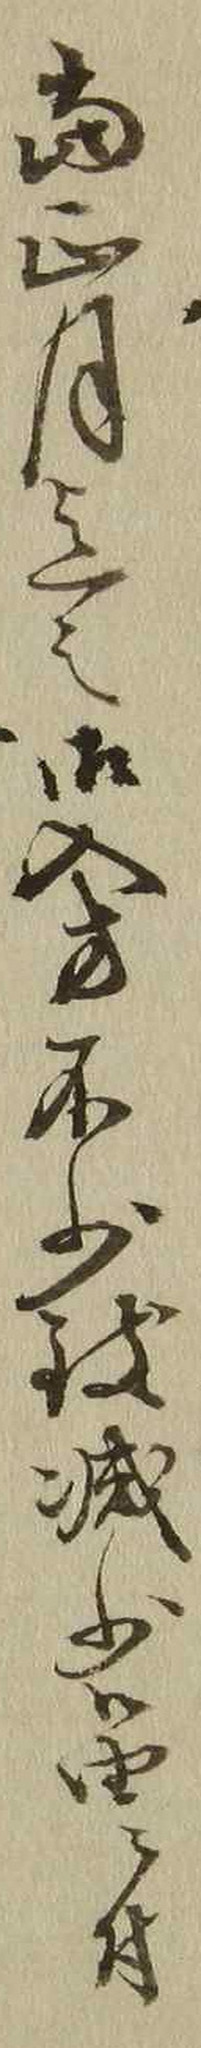当正月迄之御入方不少致減少候由ニ付
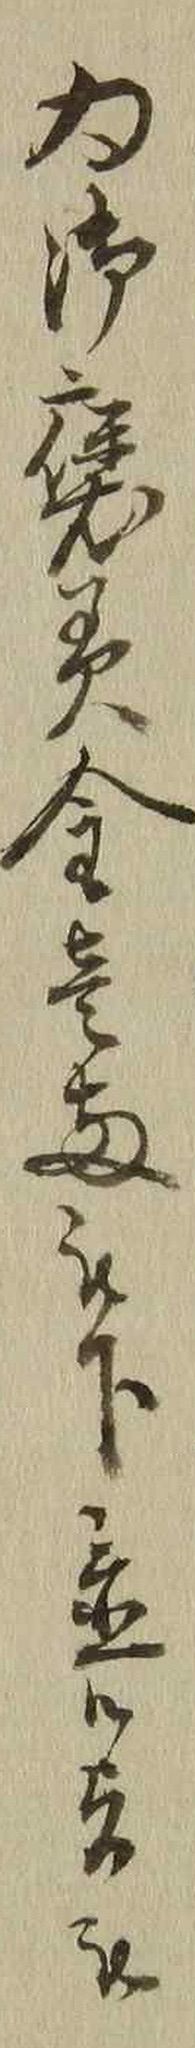為御褒美金壱両被下置候旨被
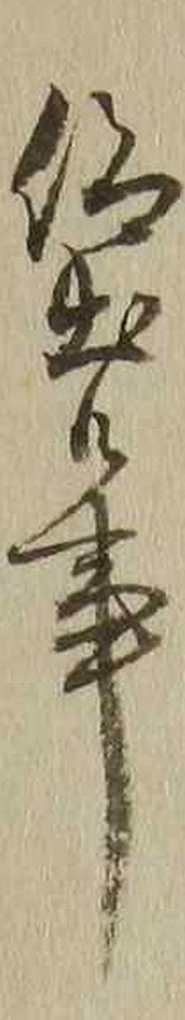仰出候事
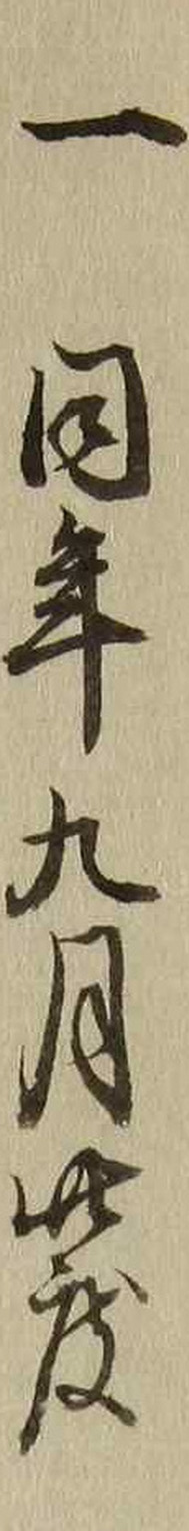一同年九月此度
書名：諸士系譜　巻之64　と之部7
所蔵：会津若松市立会津図書館
